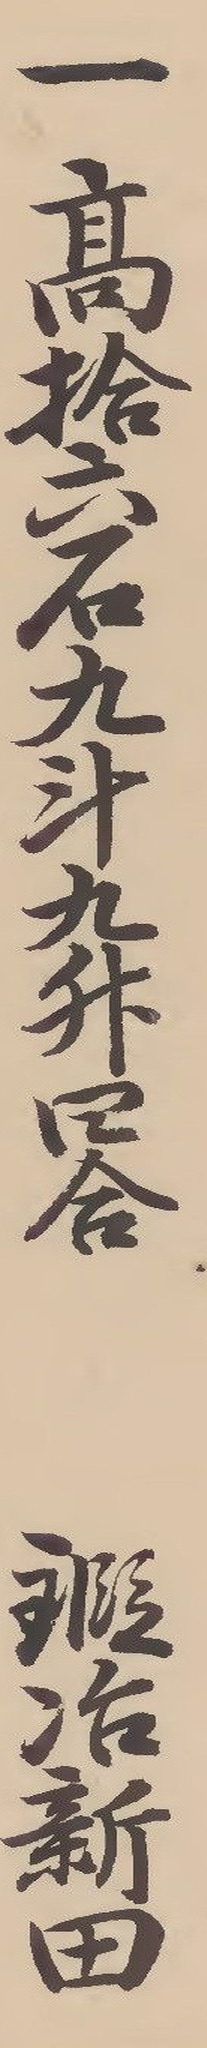一高拾六石九斗九升四合鍛冶新田

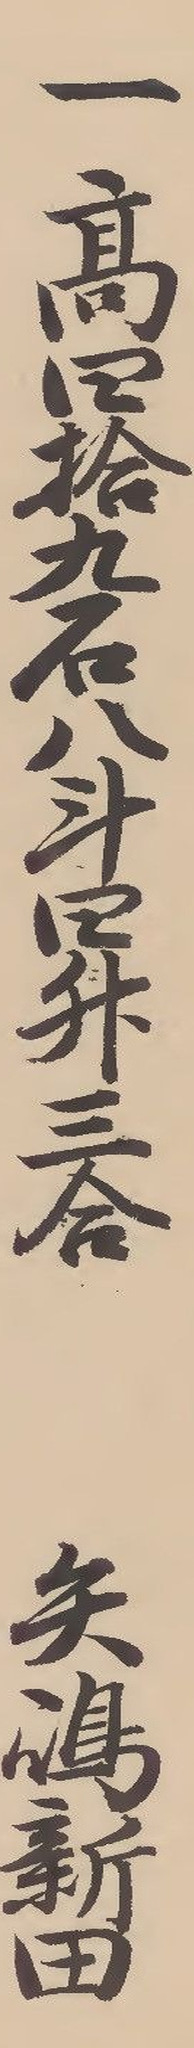一高四拾九石八斗四升三合矢島新田
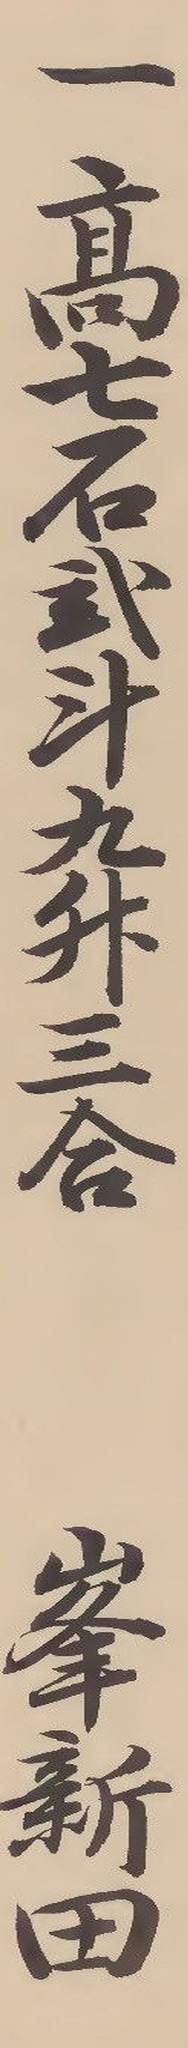一高七石弐斗九升三合峰新田
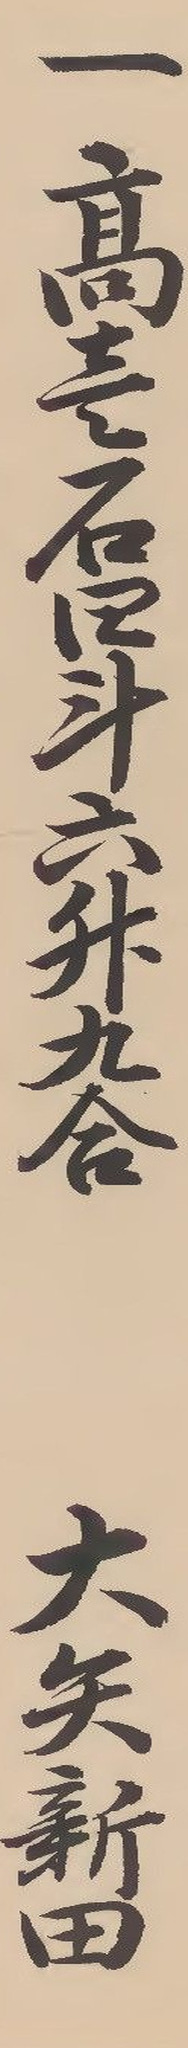一高壱石四斗六升九合大矢新田
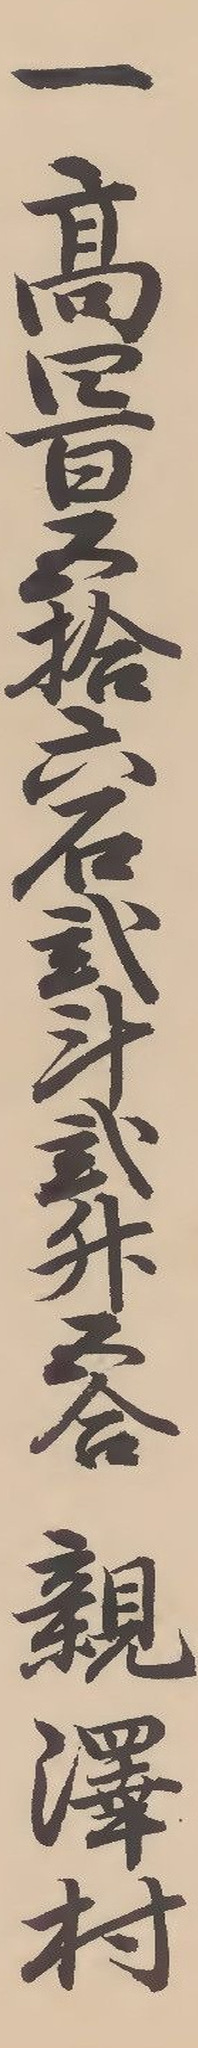一高四百五拾六石弐斗弐升五合親沢村
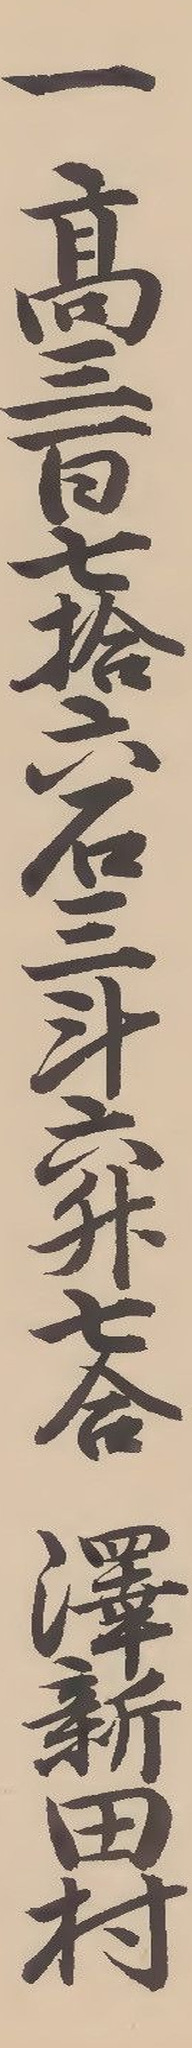一高三百七拾六石三斗六升七合沢新田村
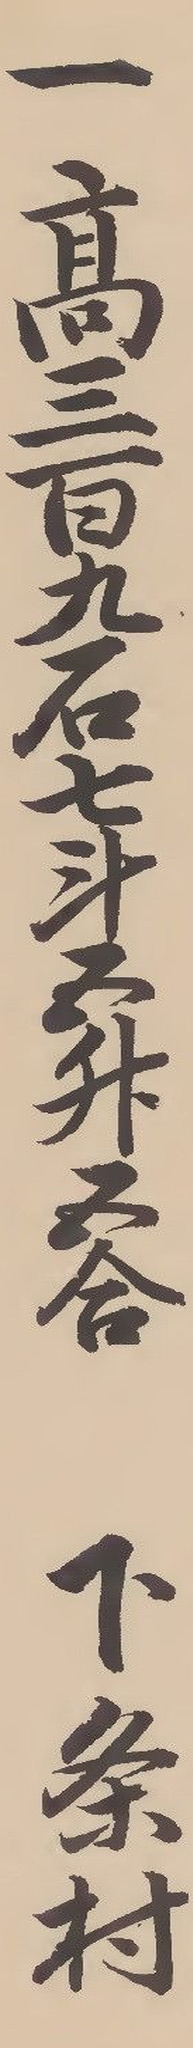一高三百九石七斗五升五合下条村
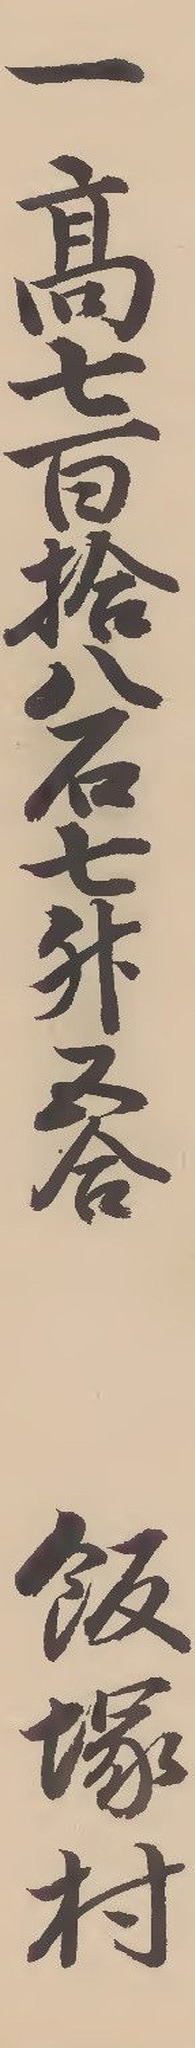一高七百拾八石七升五合飯塚村

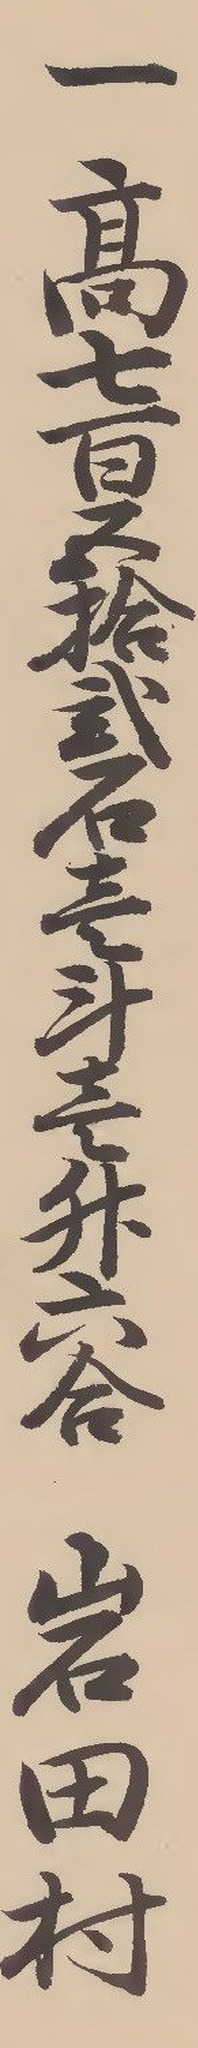一高七百五拾弐石壱斗壱升六合岩田村
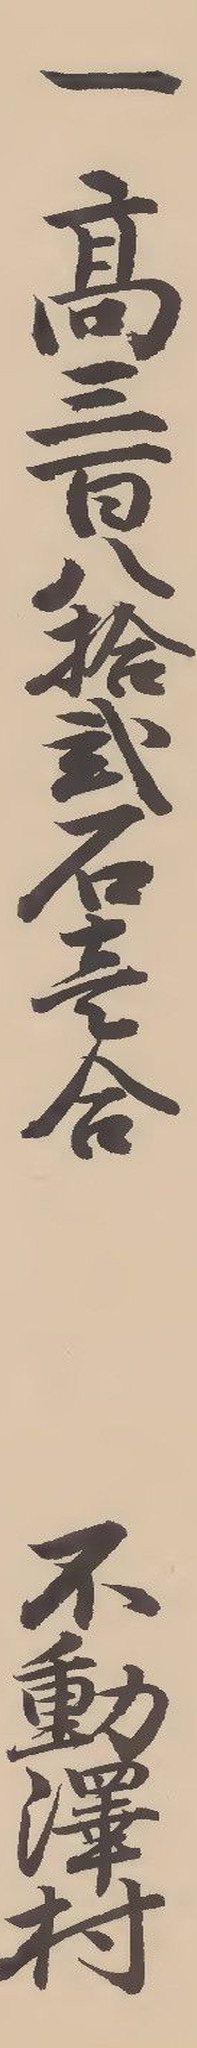一高三百八拾弐石壱合不動沢村
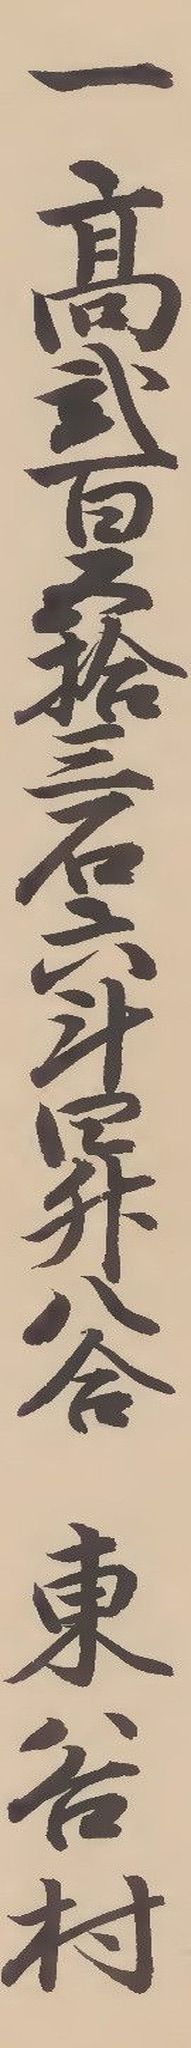一高弐百五拾三石六斗四升八合東谷村
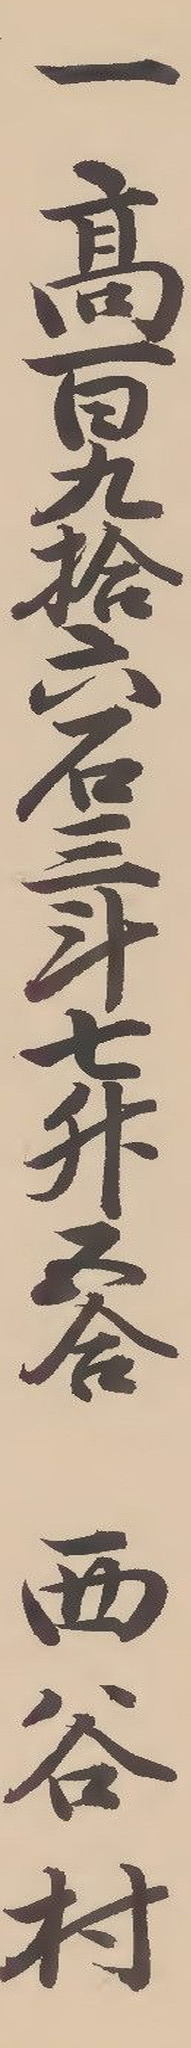一高百九拾六石三斗七升五合西谷村
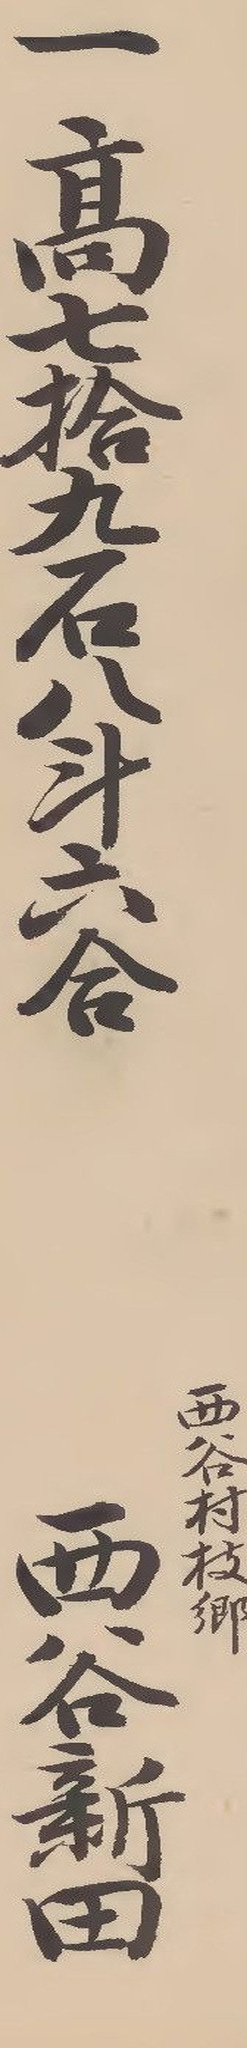一高七拾九石八斗六合西谷新田
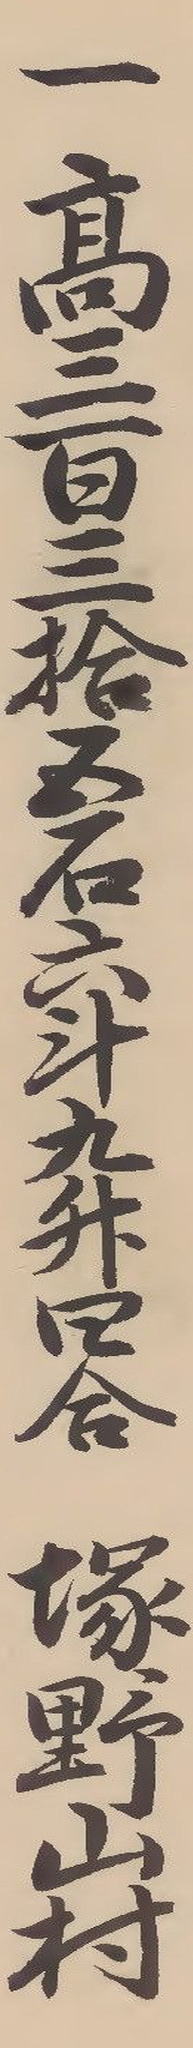一高三百三拾五石六斗九升四合塚野山村
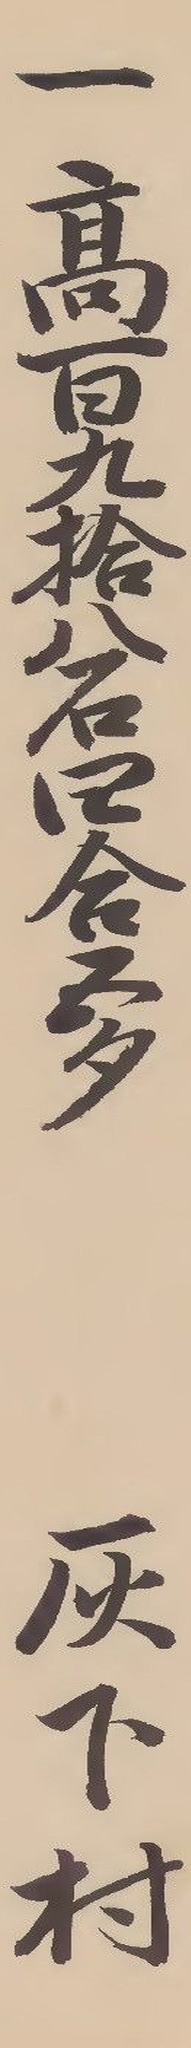一高百九拾八石四合五勺灰下村
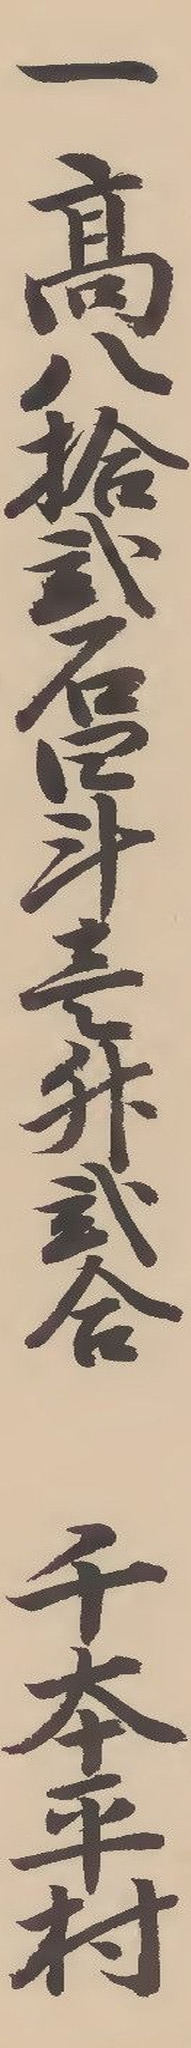一高八拾弐石四斗壱升弐合千本平村
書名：越後国郷帳　中
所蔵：国立公文書館 National Archives of Japan
